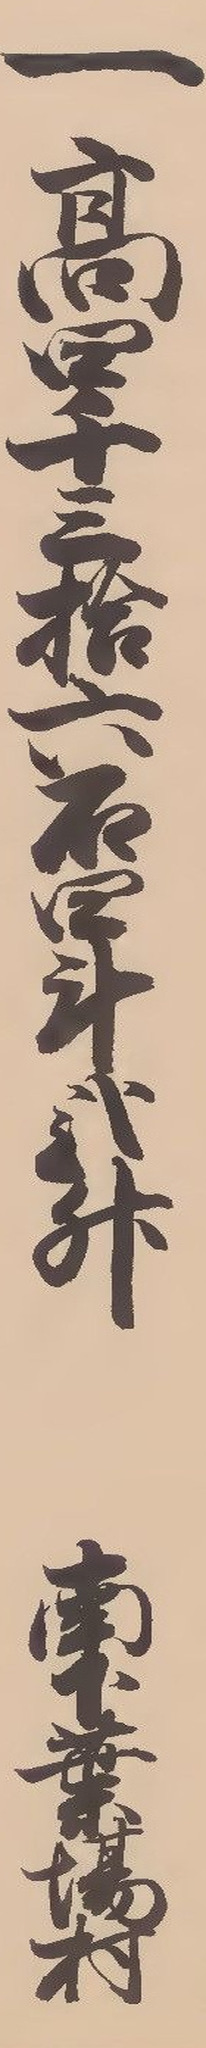一高四千三拾六石四斗弐升南下葉場村
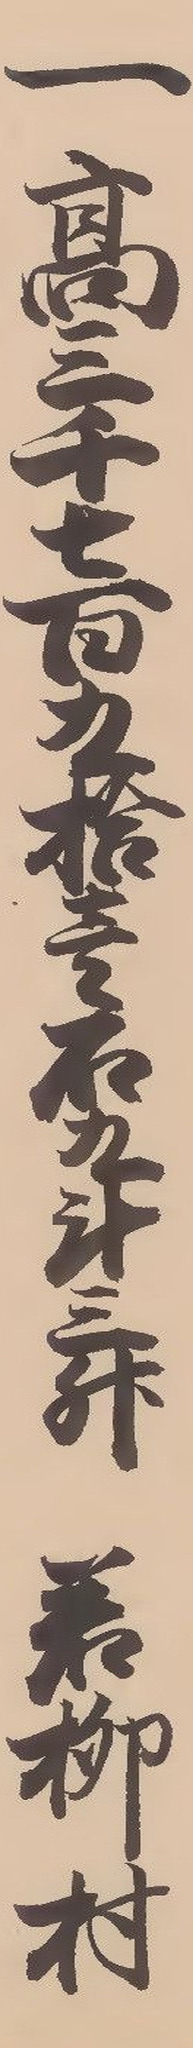一高三千七百九拾壱石九斗三升若柳村
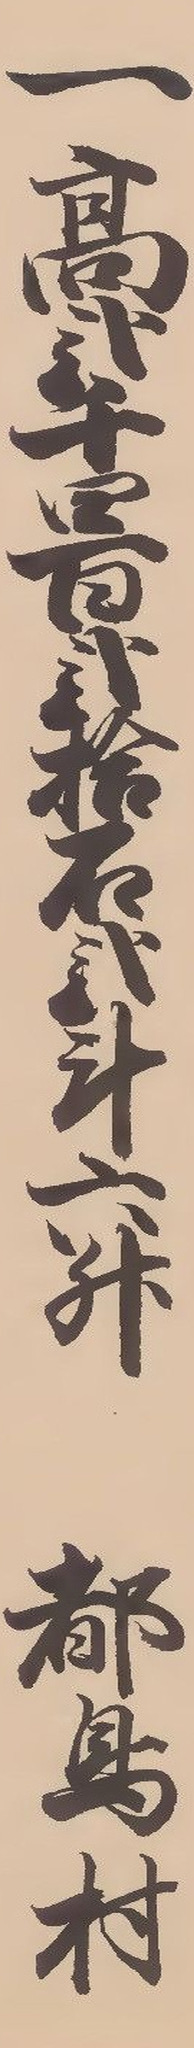一高弐千四百弐拾石弐斗六升都鳥村
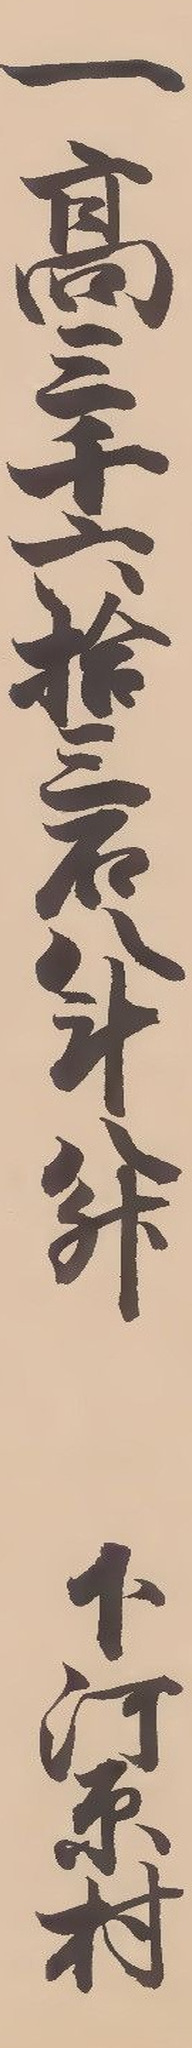一高三千六拾三石八斗八升下河原村
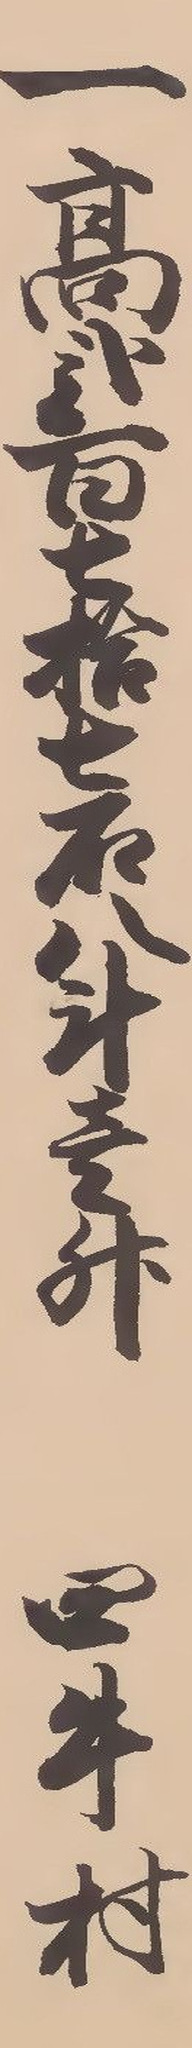一高弐百七拾七石八斗壱升四牛村
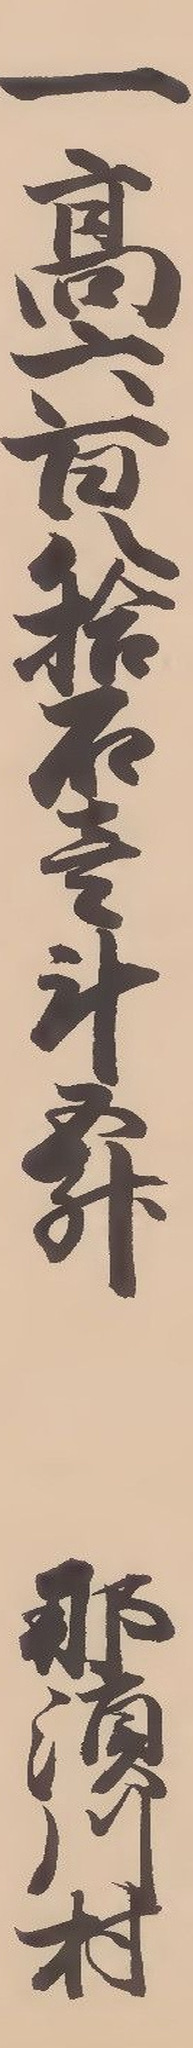一高六百八拾石壱斗五升那須川村
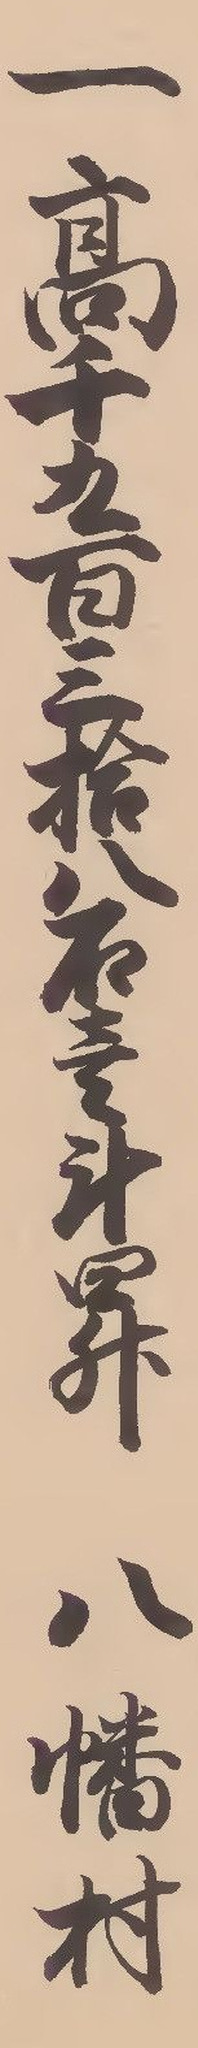一高千九百三拾八石壱斗四升八幡村

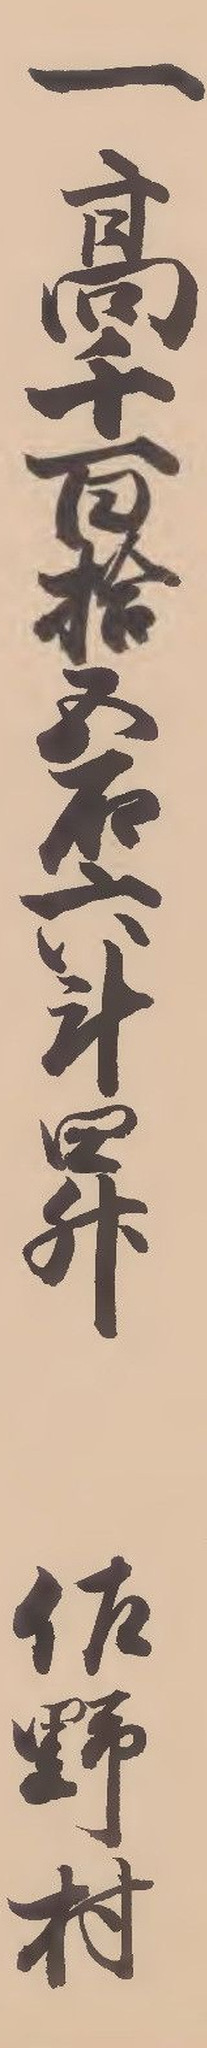一高千百拾五石六斗四升佐野村
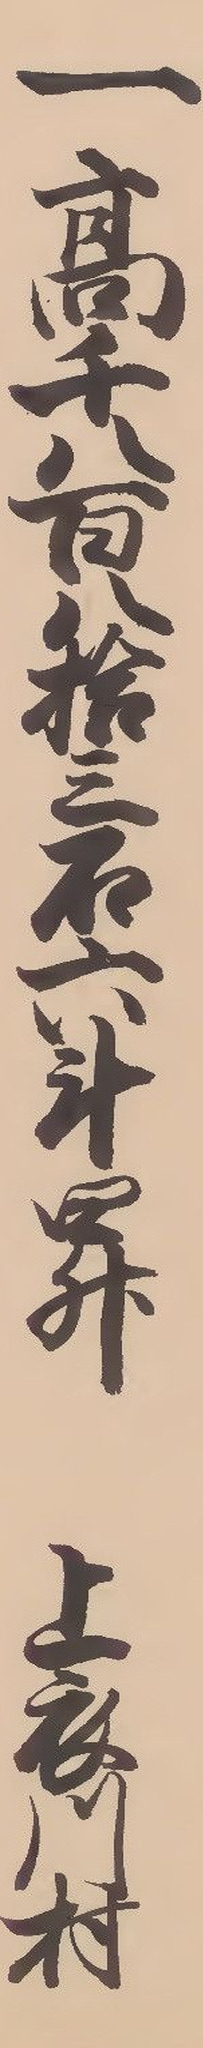一高千八百八拾三石六斗四升上衣川村
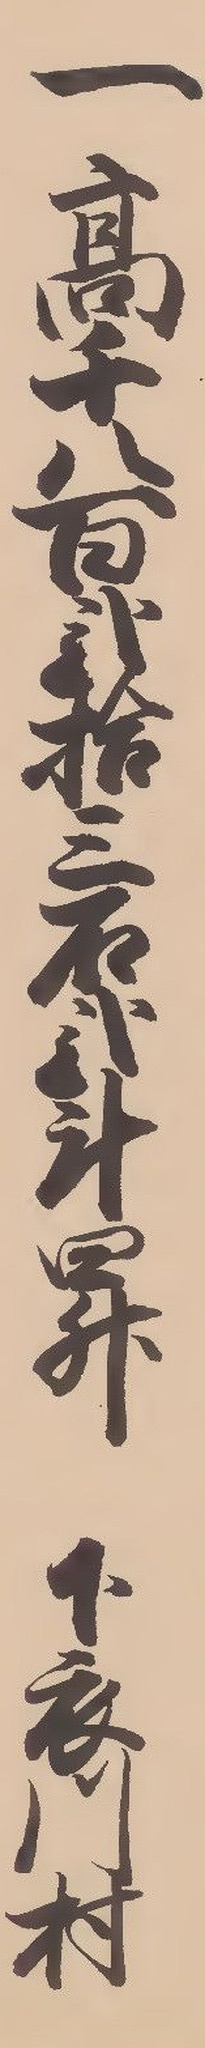一高千八百弐拾三石弐斗四升下衣川村
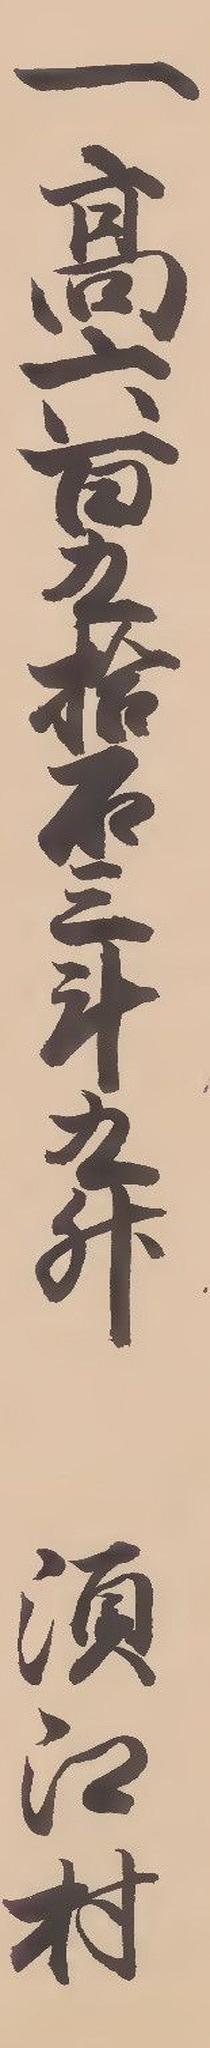一高六百九拾石三斗九升須江村
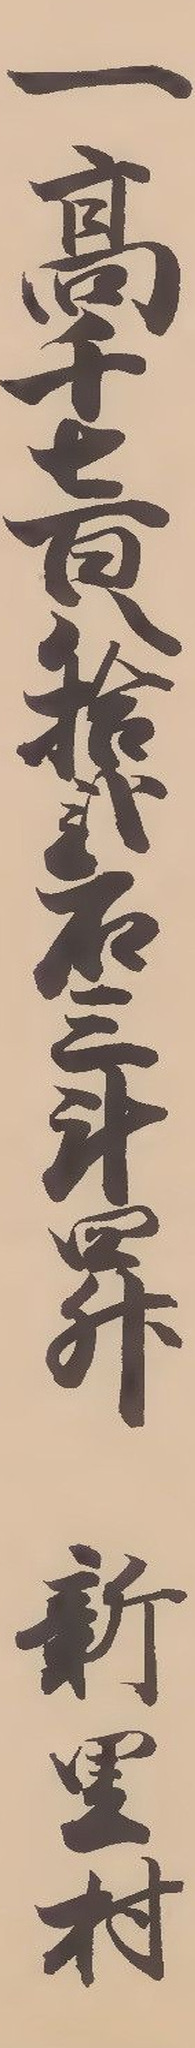一高千七百八拾弐石三斗四升新里村
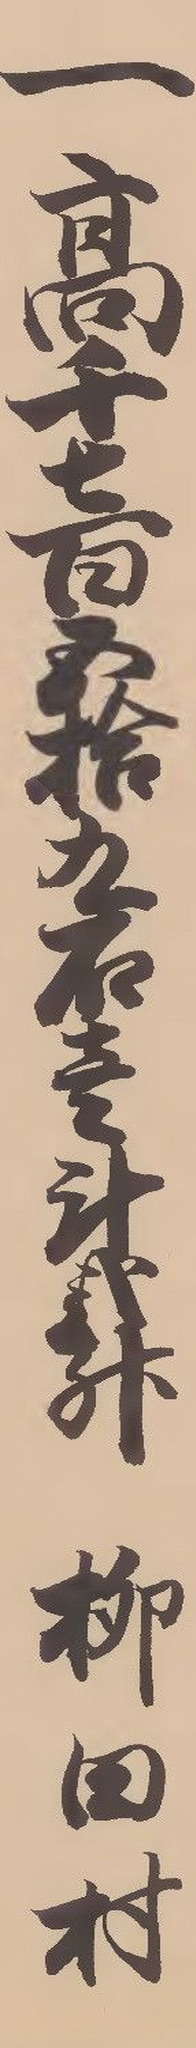一高千七百五拾九石壱斗弐升柳田村
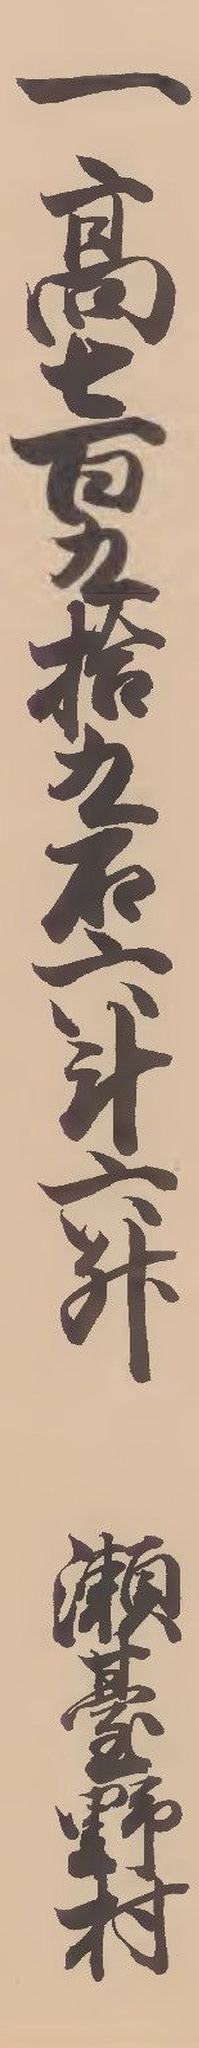一高七百九拾九石六斗六升瀬台野村

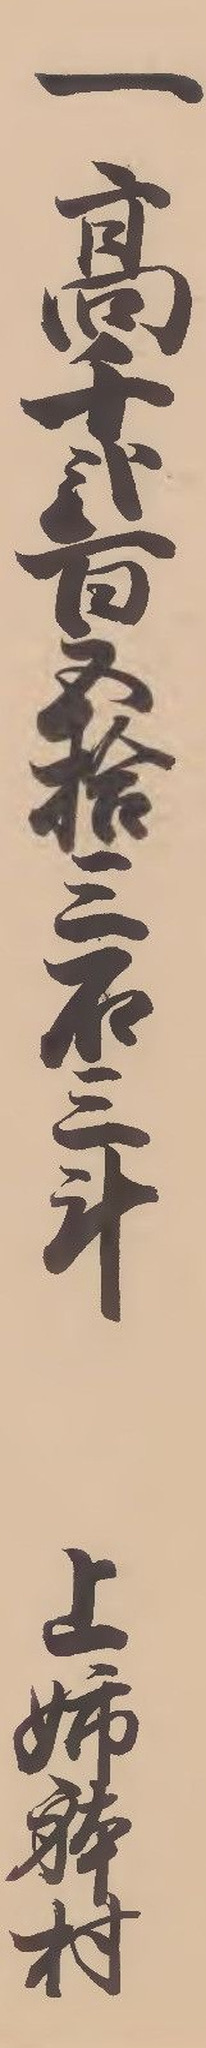一高千弐百五拾三石三斗上姉躰村
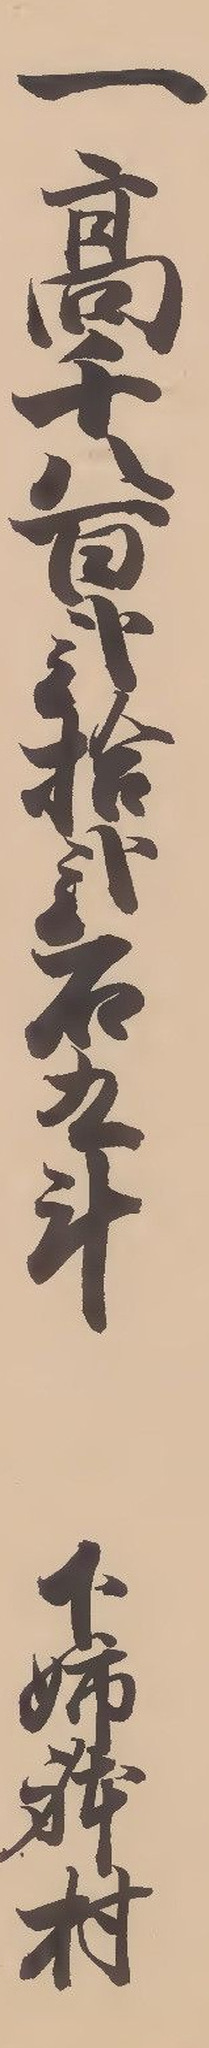一高千八百弐拾弐石九斗下姉躰村
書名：陸奥国郷帳　５
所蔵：国立公文書館 National Archives of Japan
